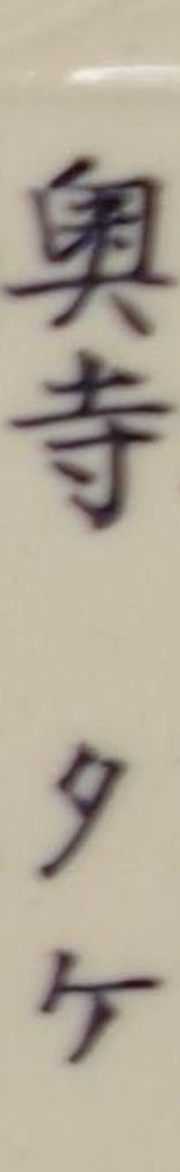奥寺タケ
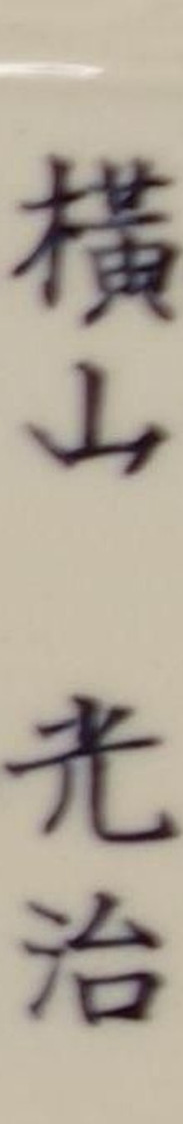横山光治
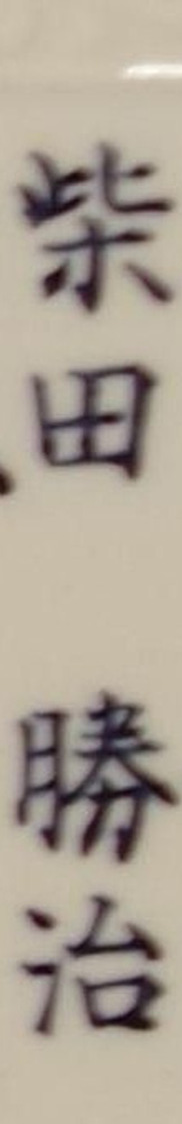柴田勝治
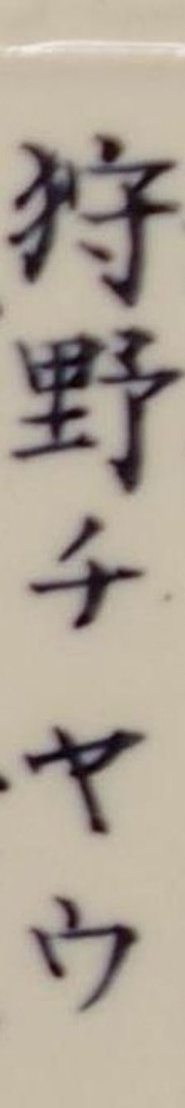狩野チヤウ
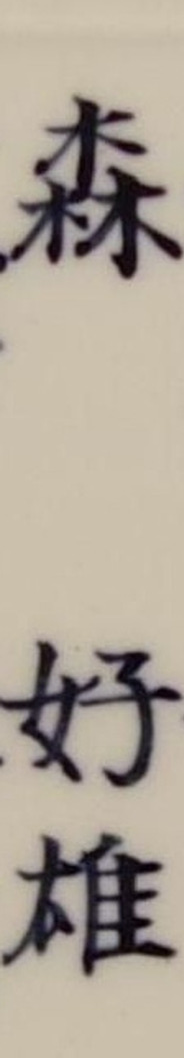森好雄
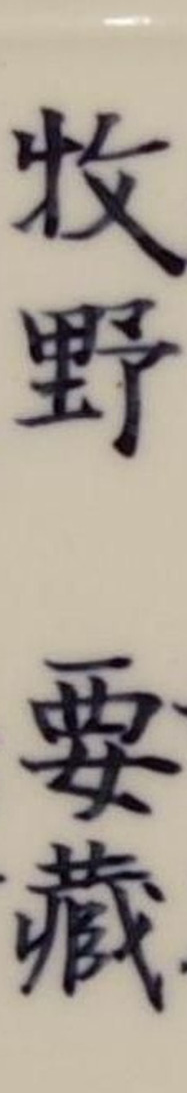牧野要蔵
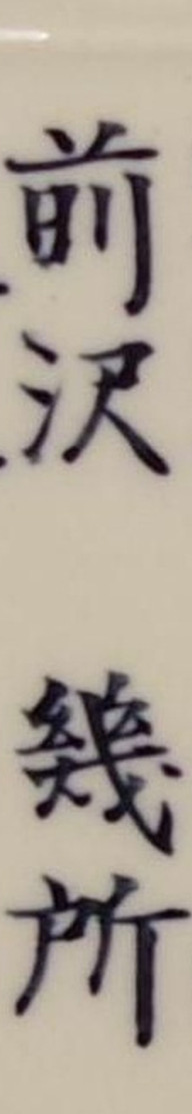前沢幾所
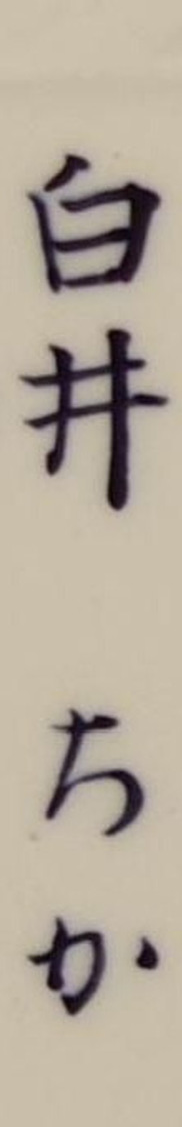白井ちか
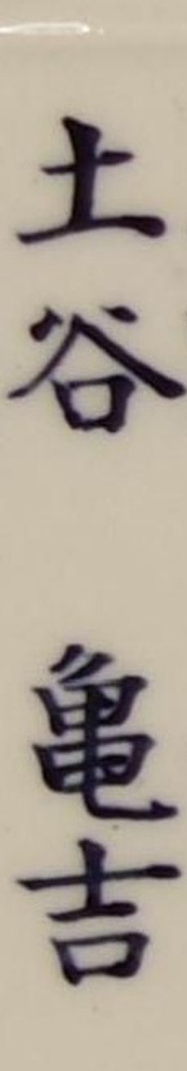土谷亀吉
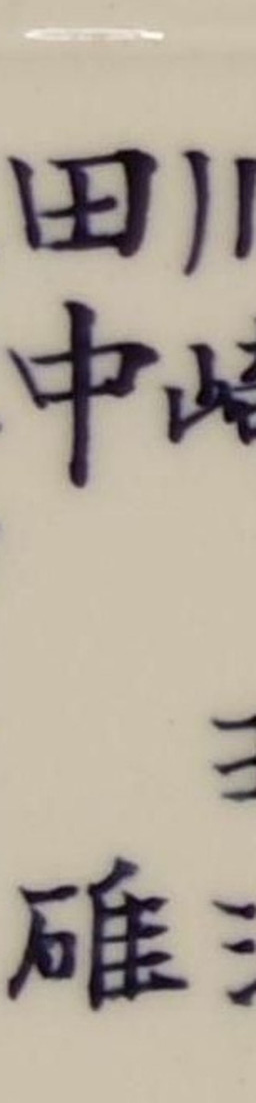田中雄
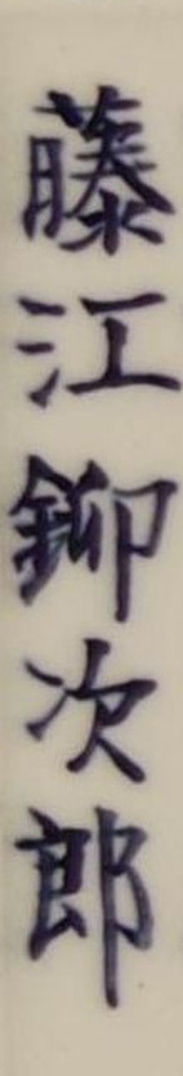藤江鉚次郎

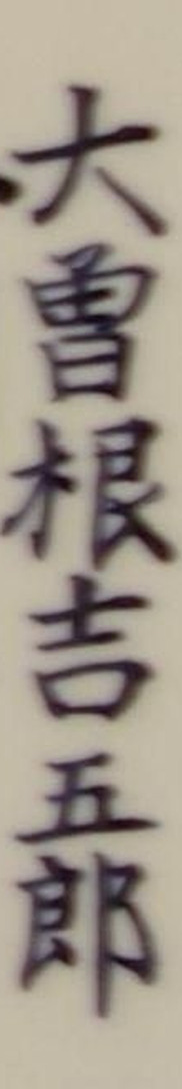大曽根吉五郎
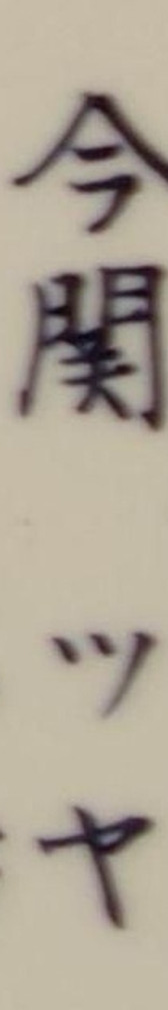今関ツヤ
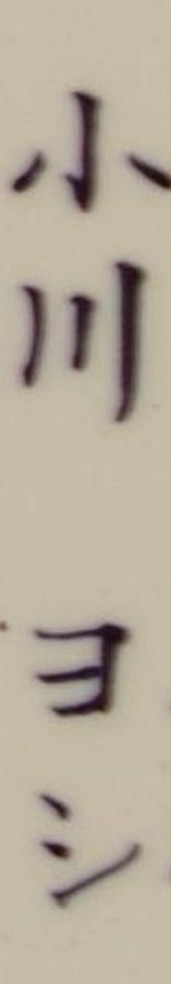小川ヨシ
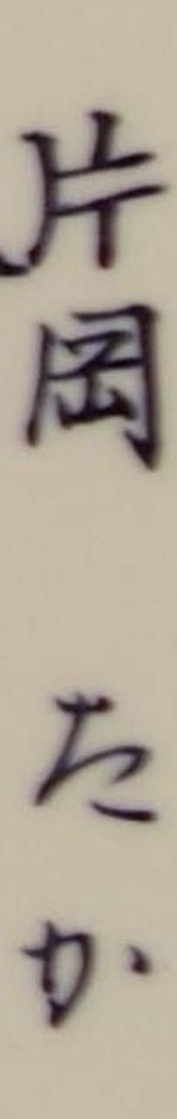片岡たか
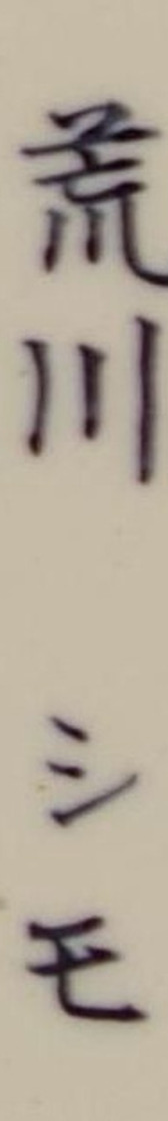荒川シモ
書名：M~S
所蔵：高野山金剛峯寺
